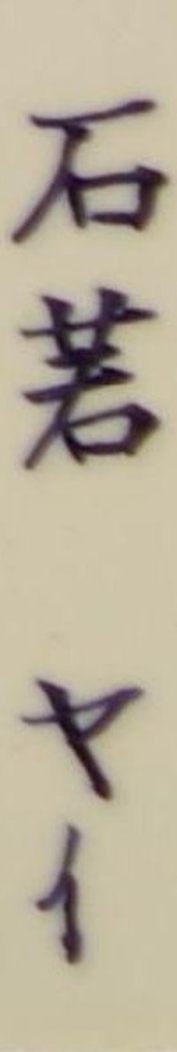石若ヤイ
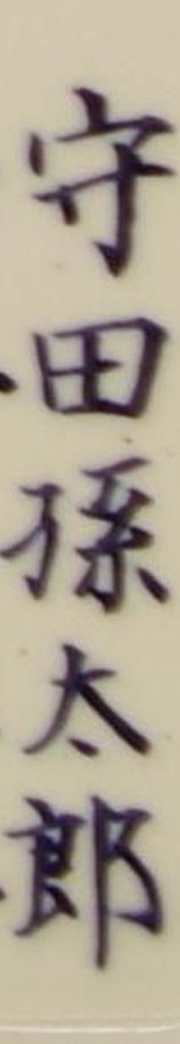守田孫太郎
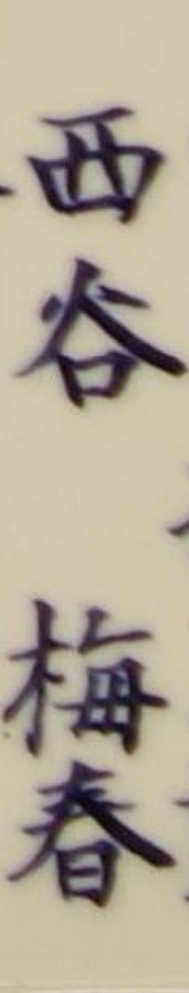西谷梅春
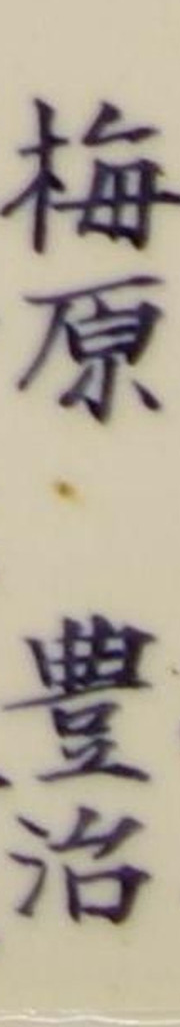梅原豊治
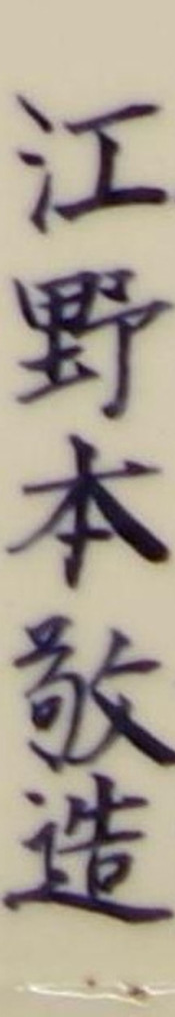江野本敬造
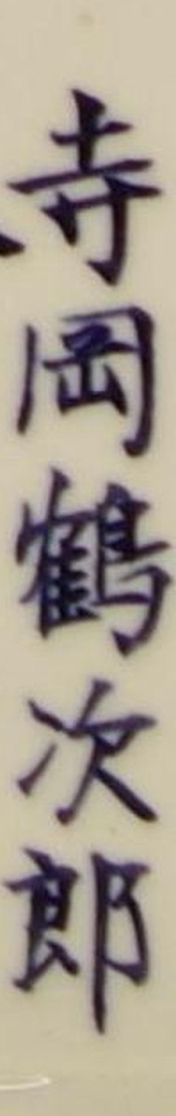寺岡鶴次郎
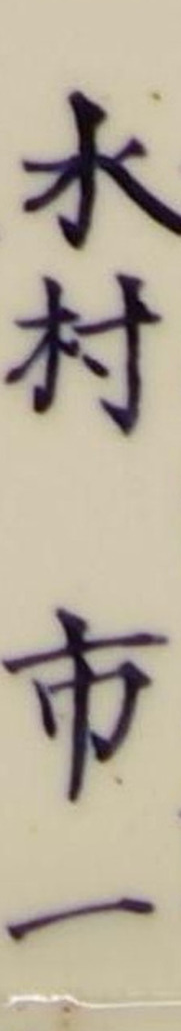水村市一
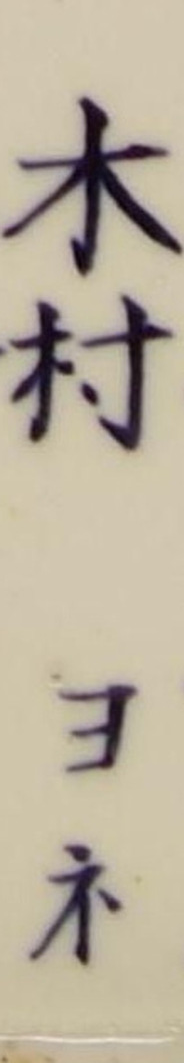木村ヨネ
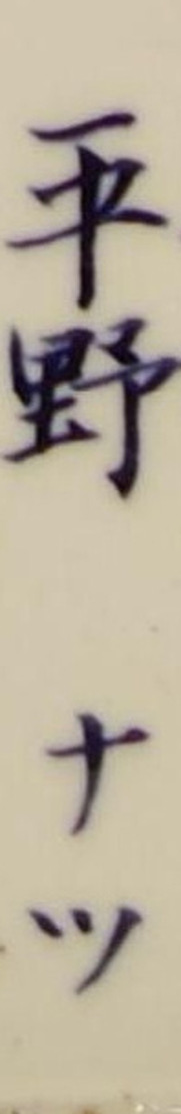平野ナツ
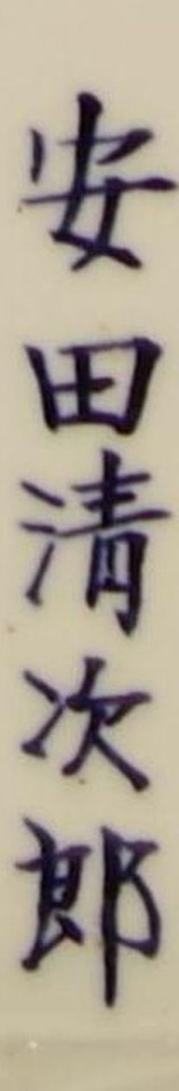安田清次郎
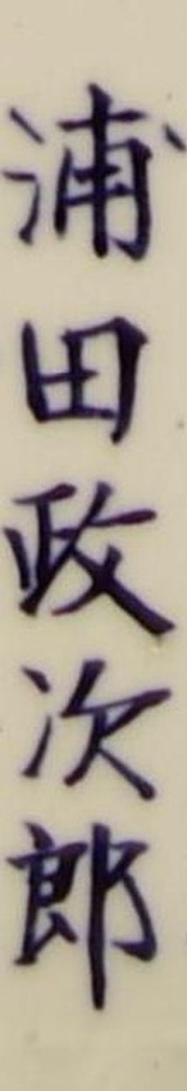浦田政次郎
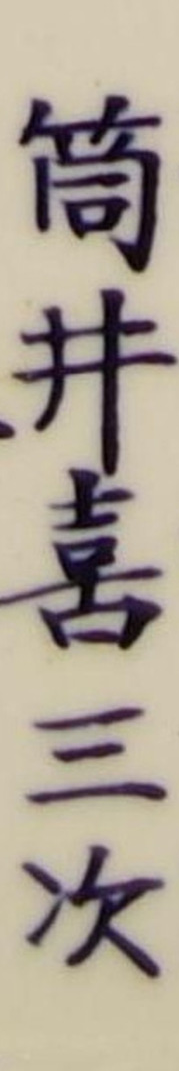筒井喜三次
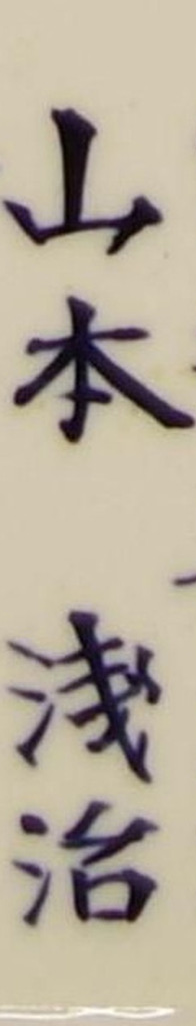山本浅治
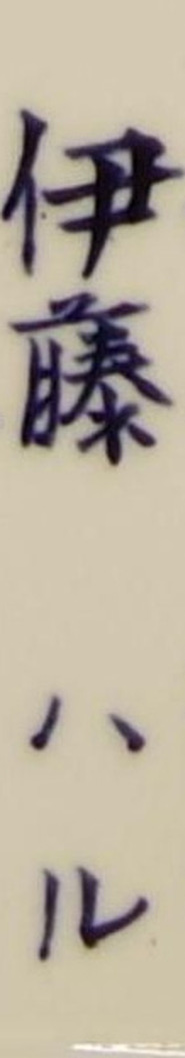伊藤ハル
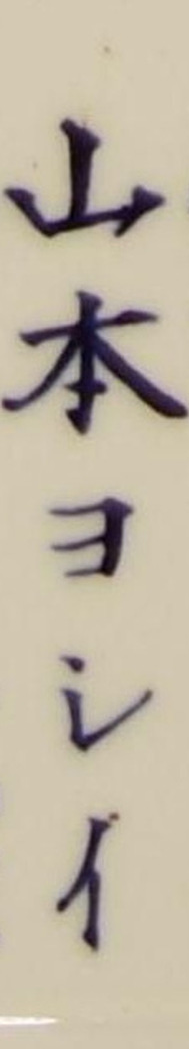山本ヨシイ
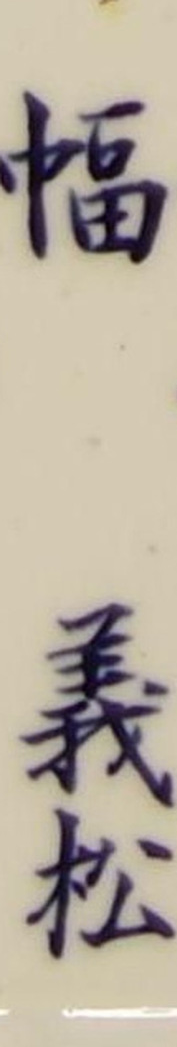幅義松
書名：A~D
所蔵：koyasan kongobuji
